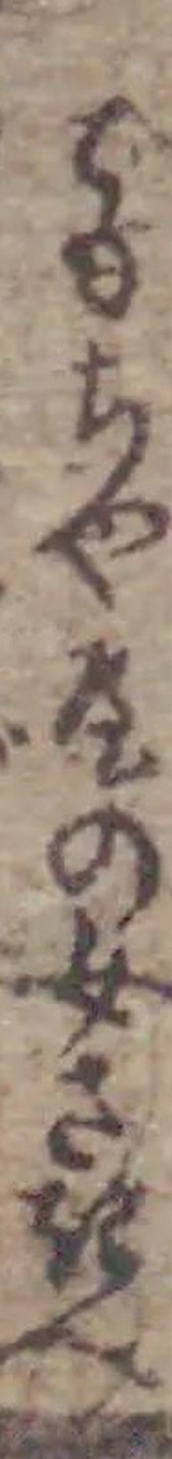てもちや屋の女さきへ
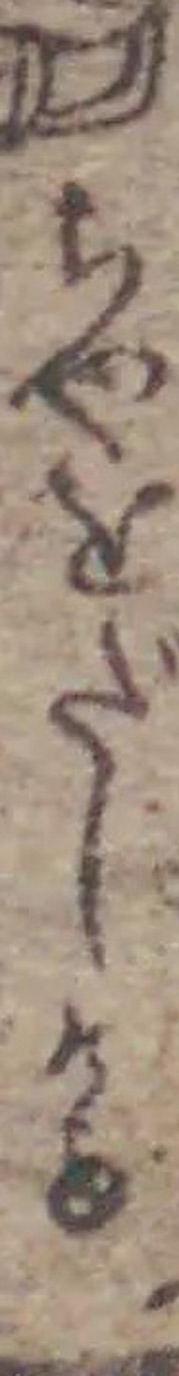ちやをだしける
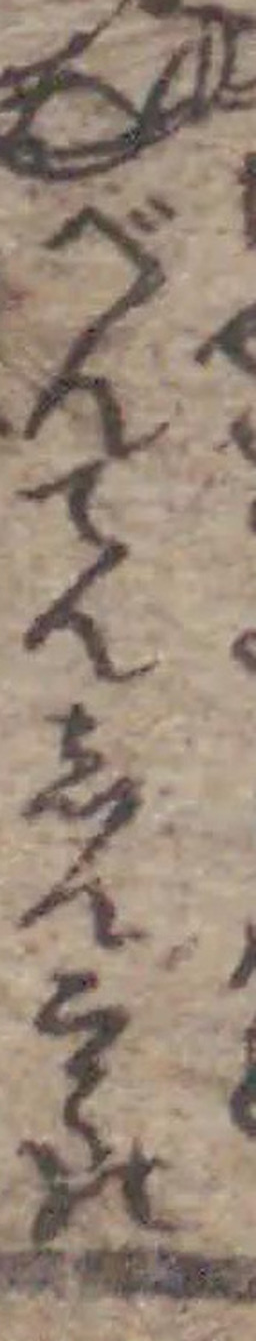べんてんしんこうの
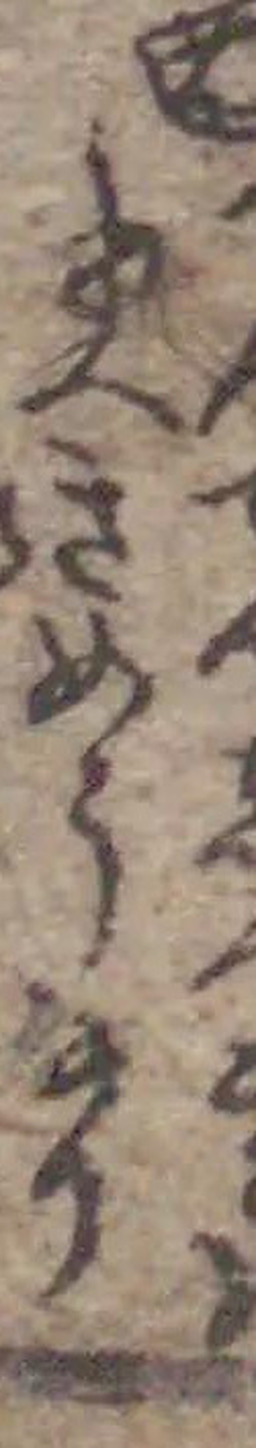ゆへきめうなり
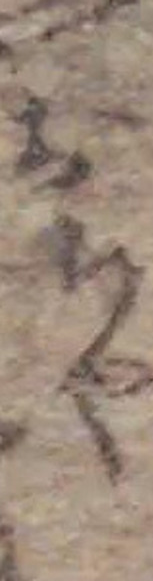おちや

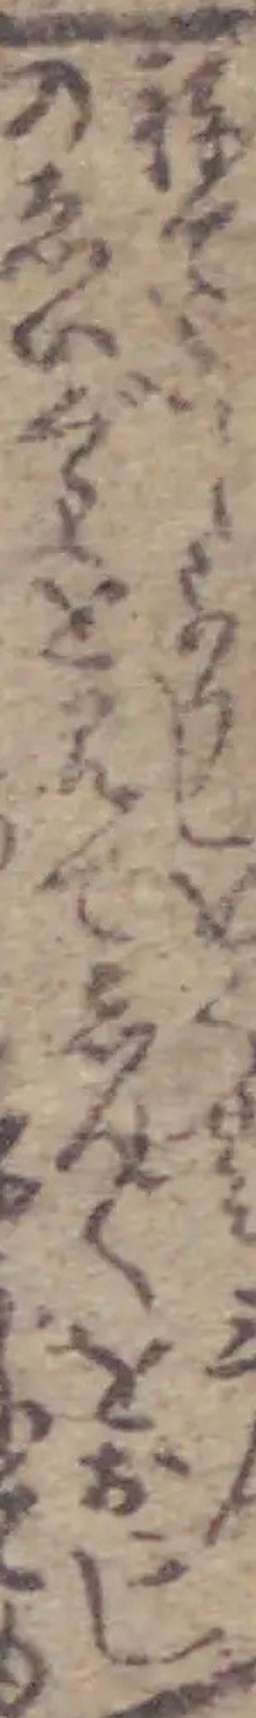のゑいぐわを見てしん〳〵をおこし
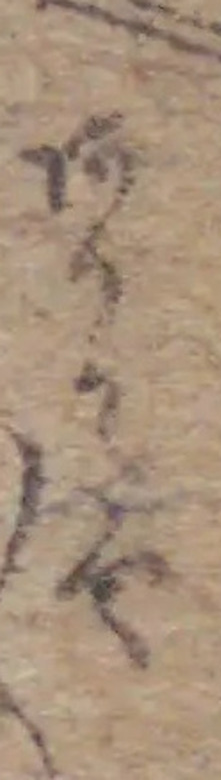ありかたや
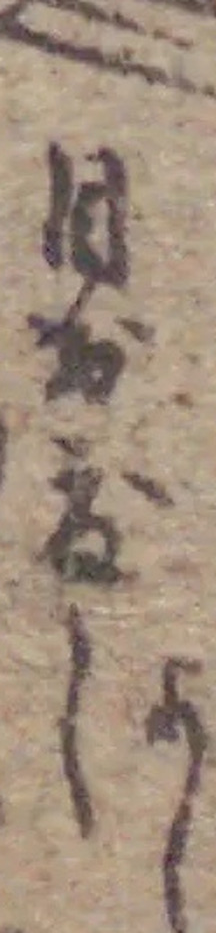目出度し
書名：日待御利生此ごろ噂 3巻
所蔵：国立国会図書館 National Diet Library, JAPAN
